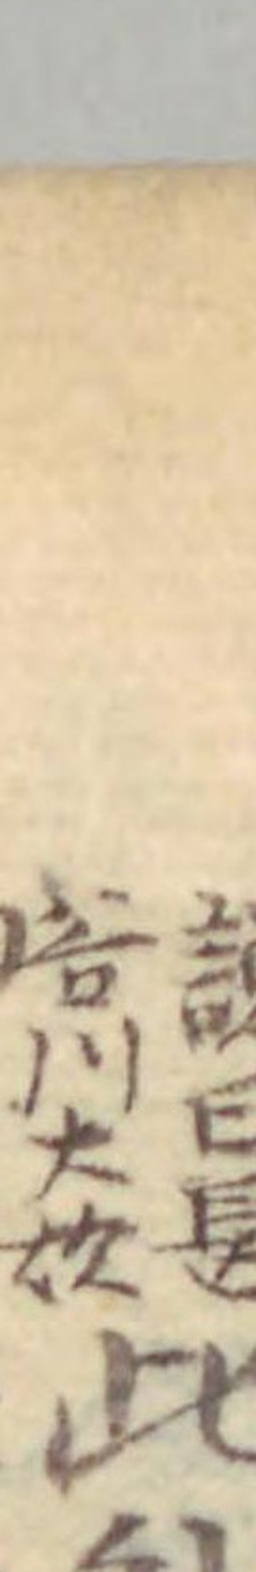谷川大炊
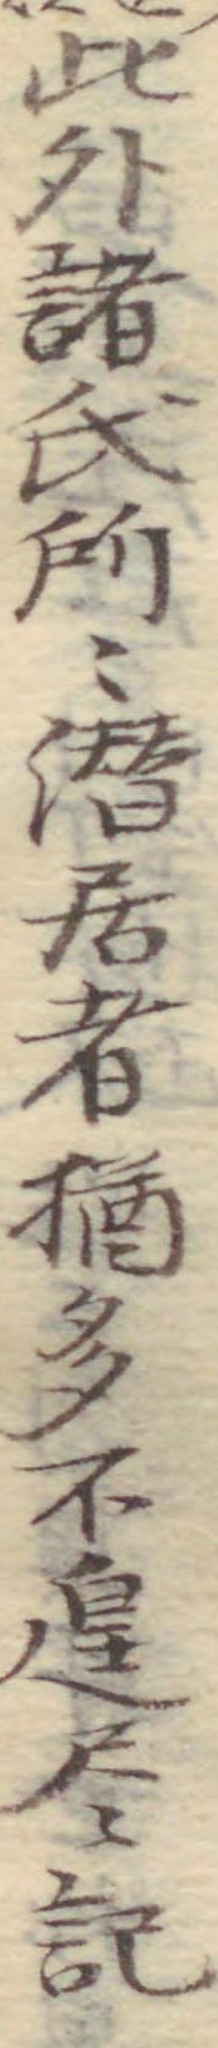此外諸氏所々潜居者猶多不逞尽記
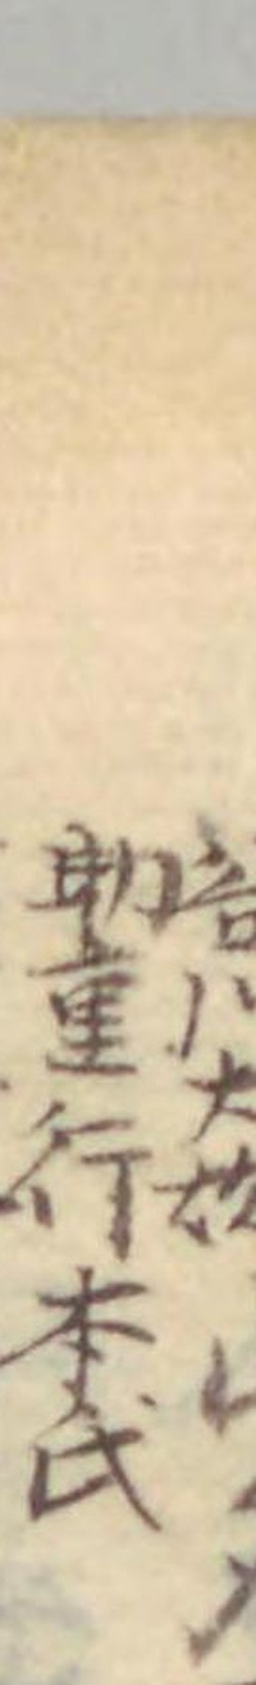助重行本氏
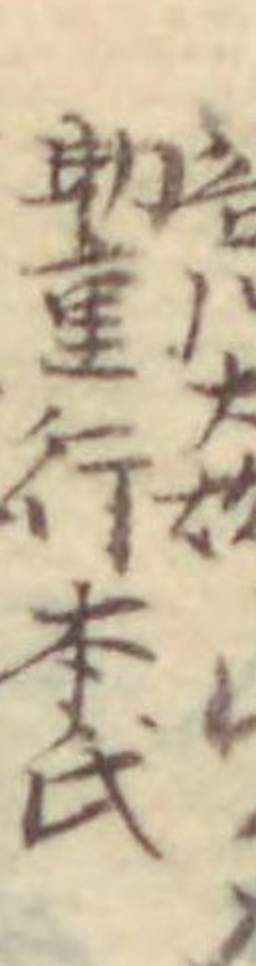助重行本氏
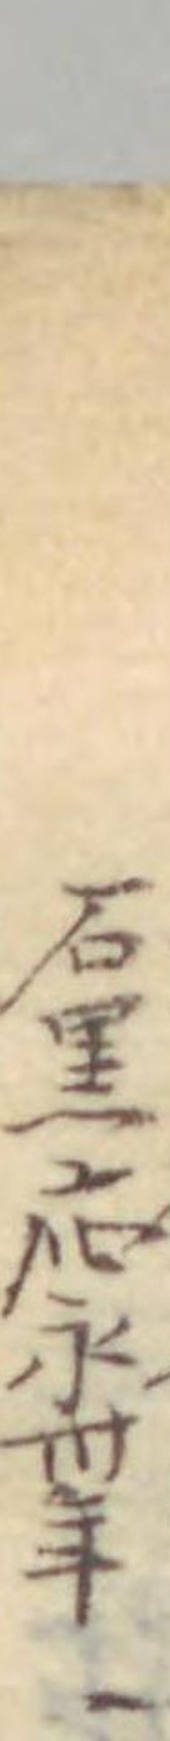石黒応永卅年
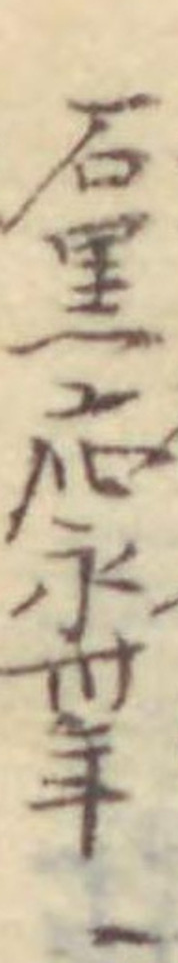石黒応永卅年
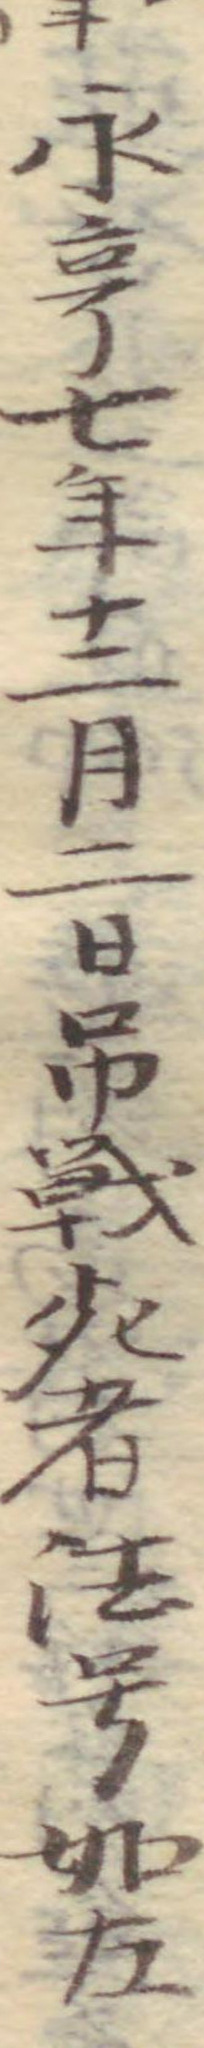永亨七年十二月二日吊戦死者法号如左
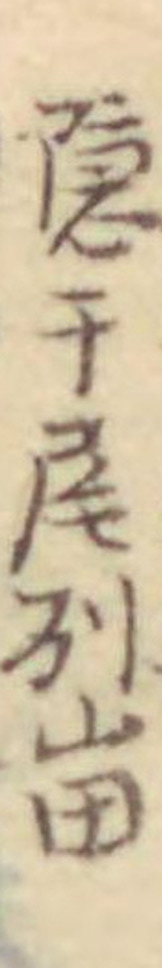隠于尾州山田
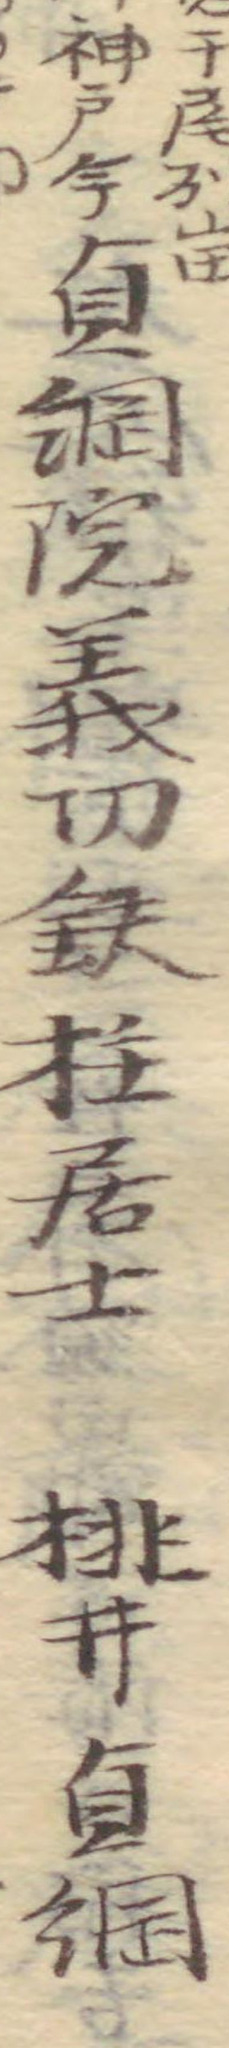貞綱院義切鉄柱居士桃井貞綱
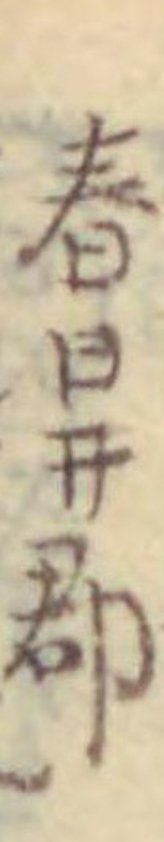春日井郡
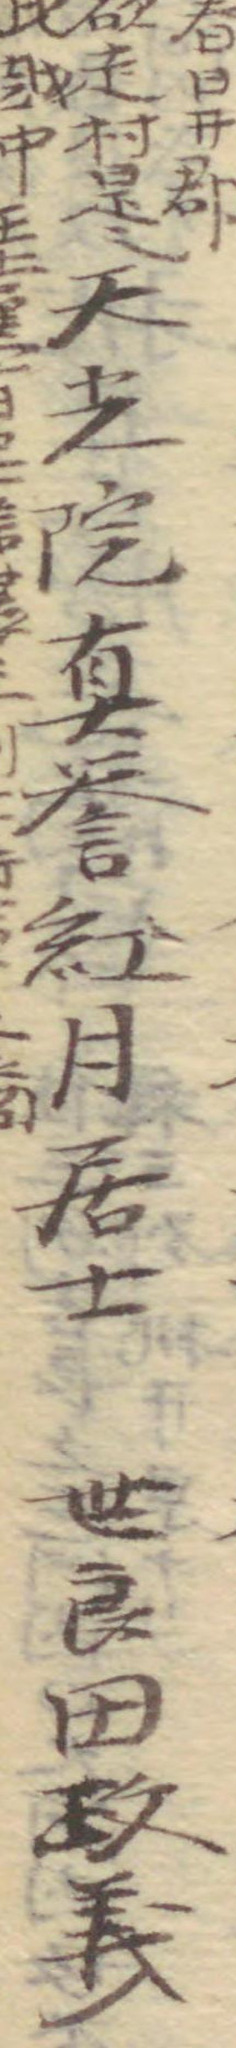天光院真誉紅月居士世良田政義
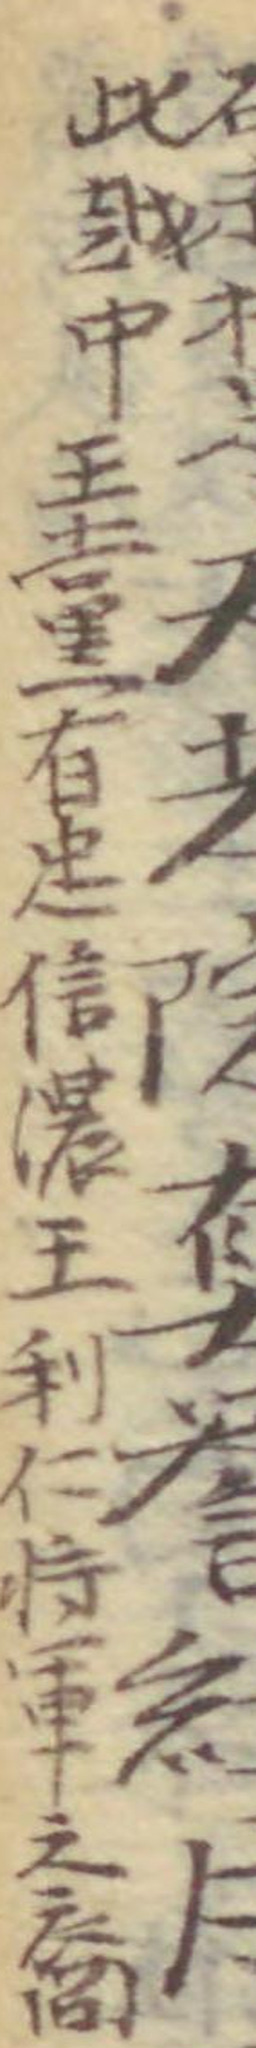此越中王党有忠信濃王利仁将軍之裔
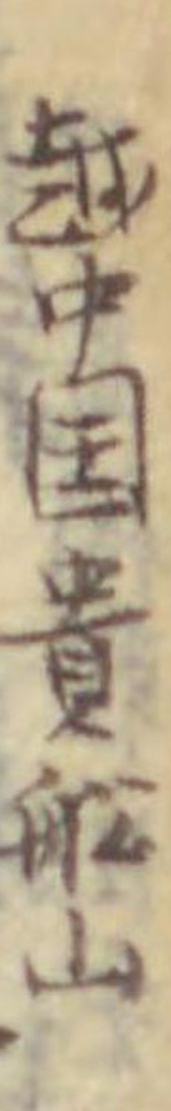越中国貴船山
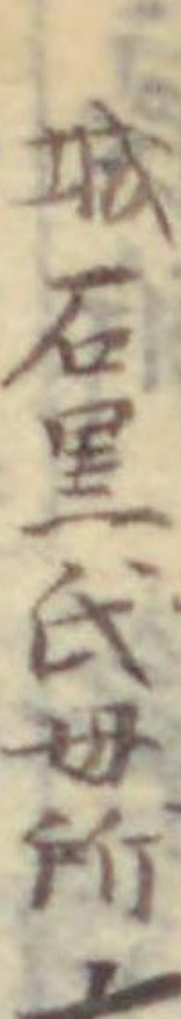城石黒氏母所
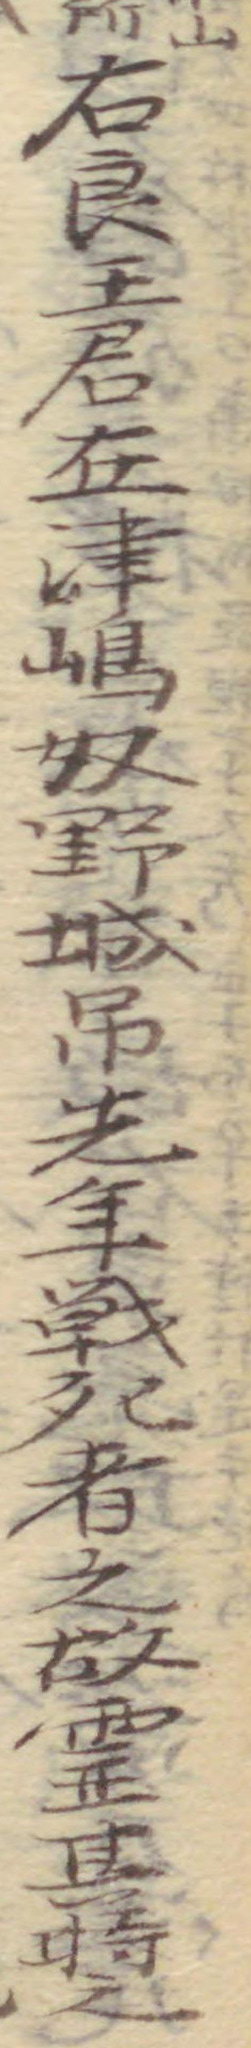右良王君在津嶋奴野城吊先年戦死者之故令霊其時之号也
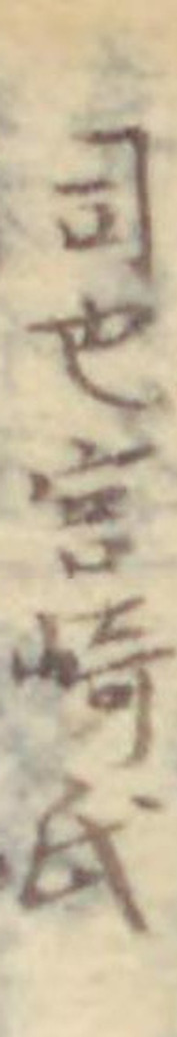可也宮崎氏
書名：鶯宿雑記. 巻199-200
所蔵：国立国会図書館 National Diet Library, JAPAN
